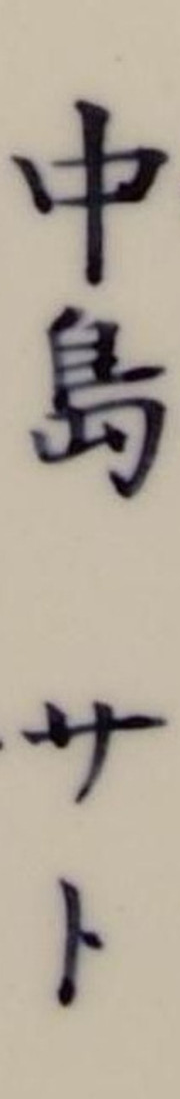中島サト
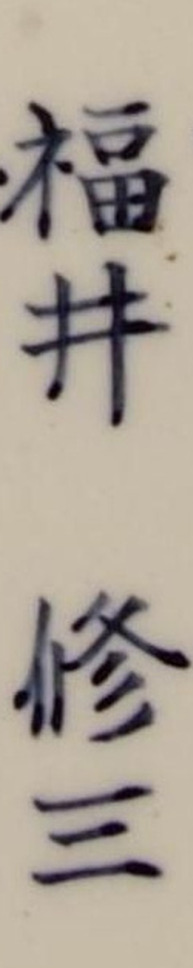福井修三
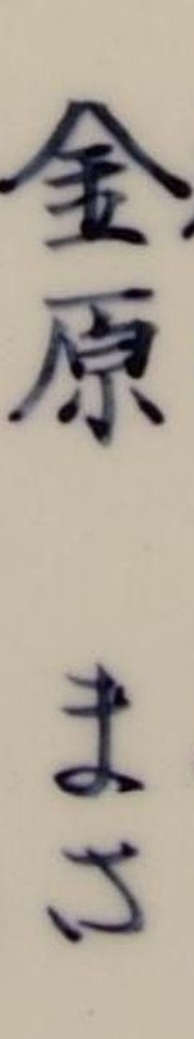金原まさ
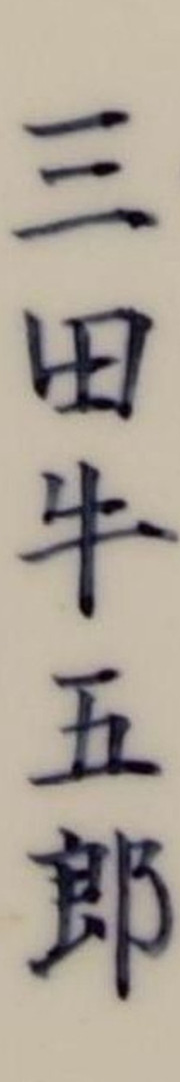三田牛五郎
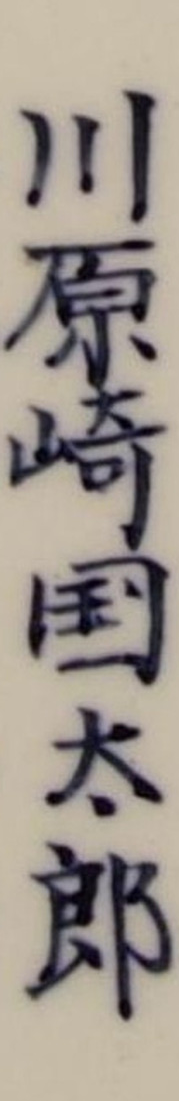川原崎国太郎
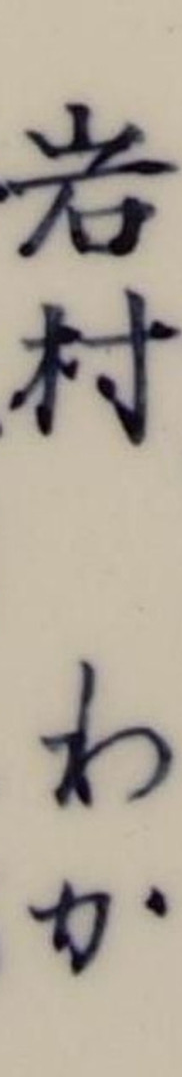岩村わか
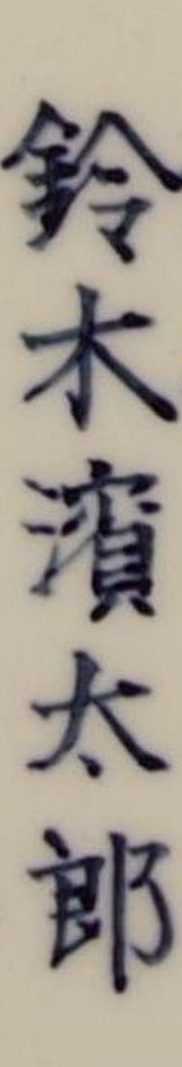鈴木濱太郎
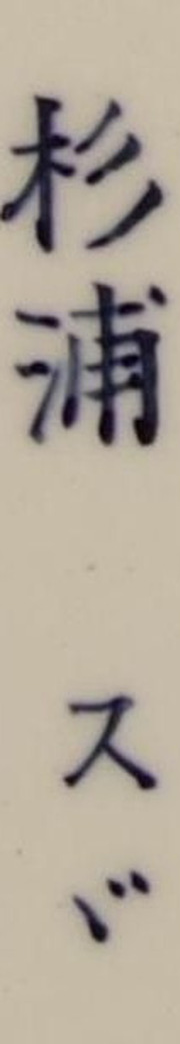杉浦スゞ
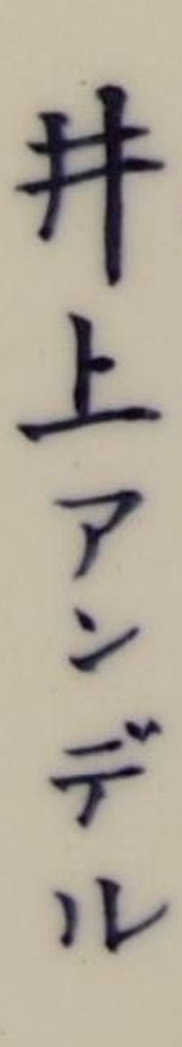井上アンデル
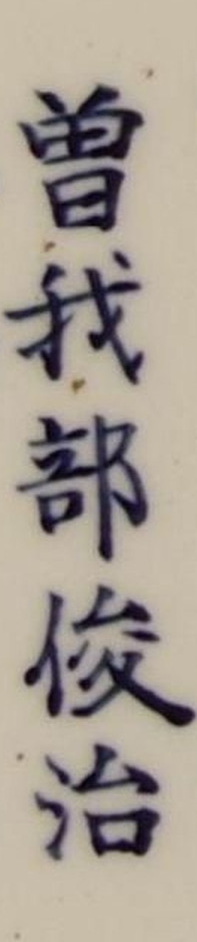曽我部俊治
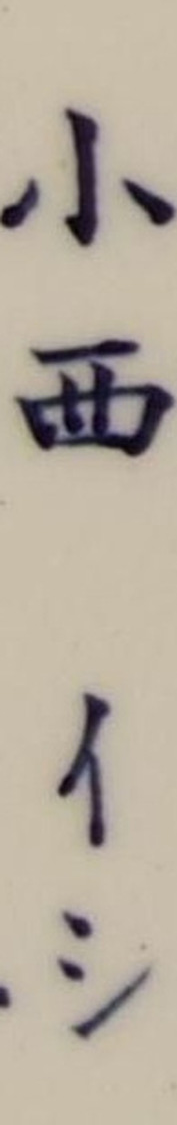小西イシ
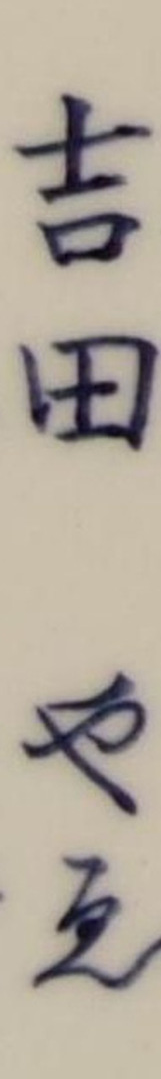吉田やゑ
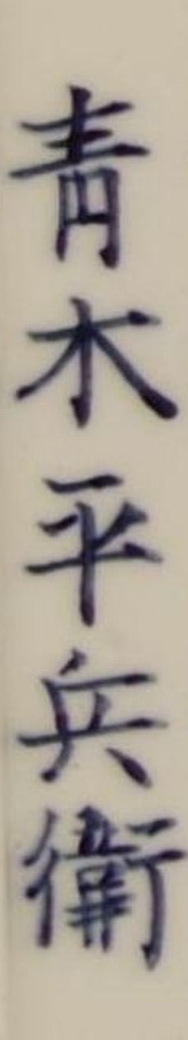青木平兵衛

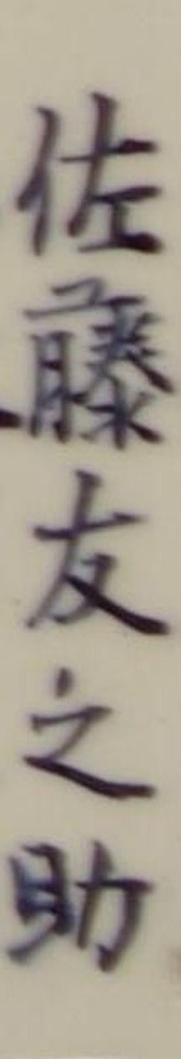佐藤友之助
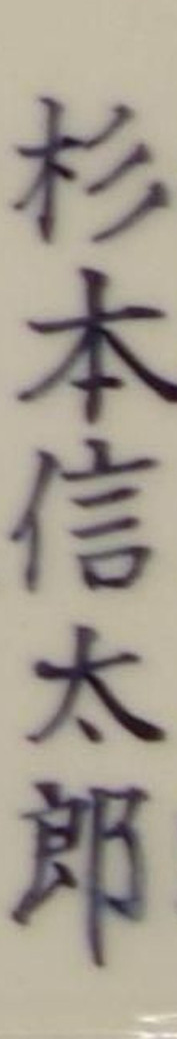杉本信太郎
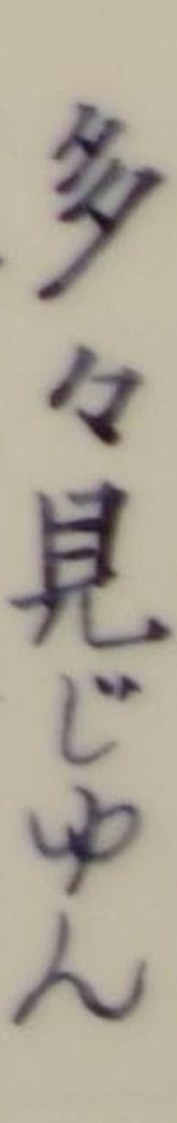多々見じゆん
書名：M~S
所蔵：高野山金剛峯寺
